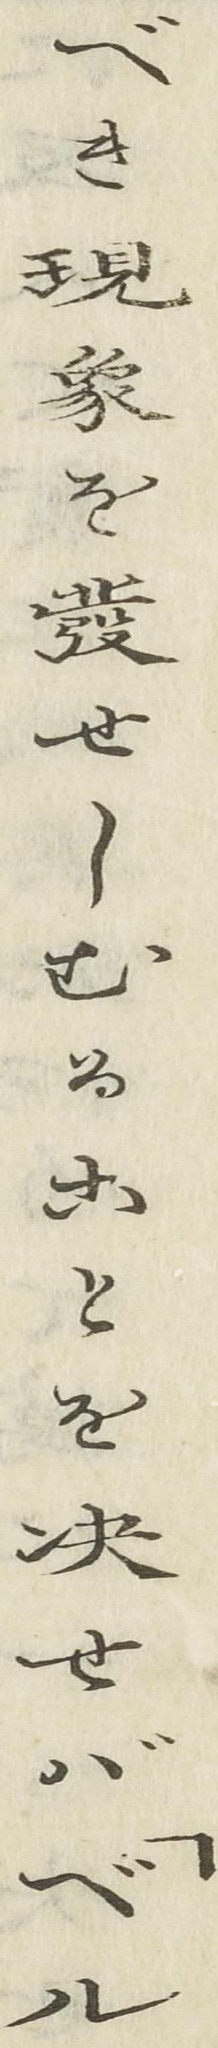べき現象を発せしむることを決せば「ベル
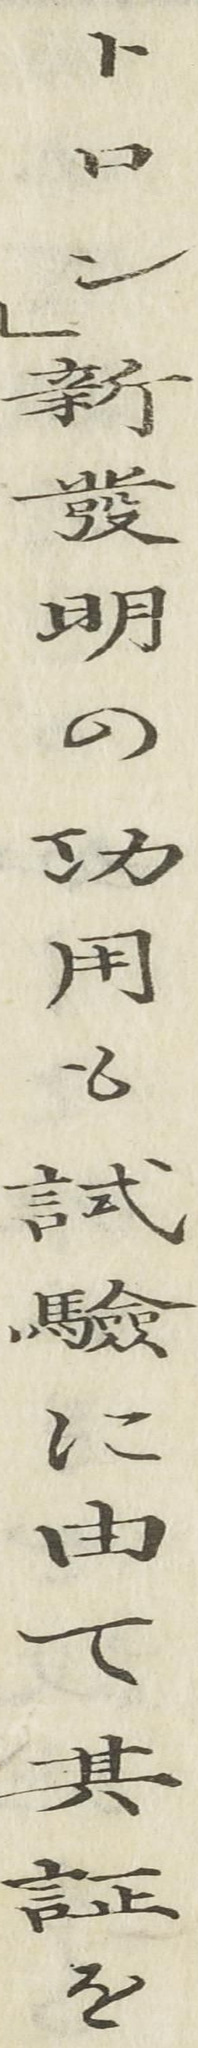トロン」新発明の功用も試験に由て其証を
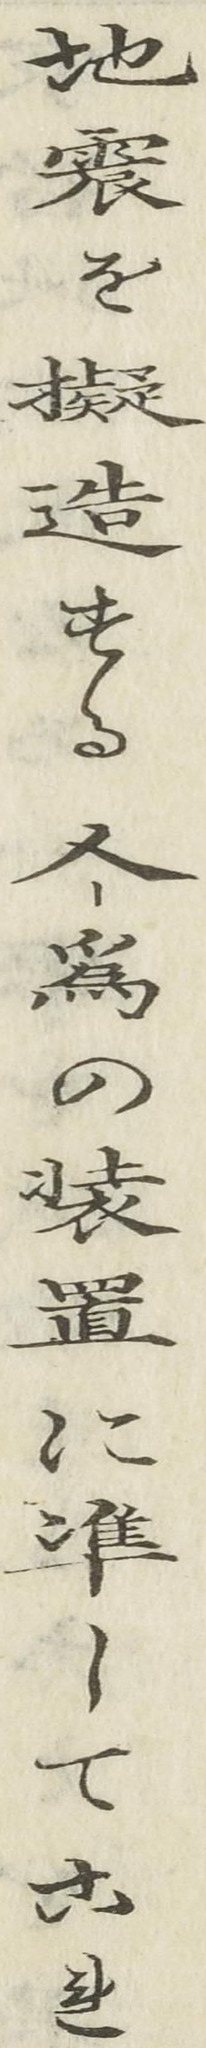地震を擬造する人為の装置に準してこれ
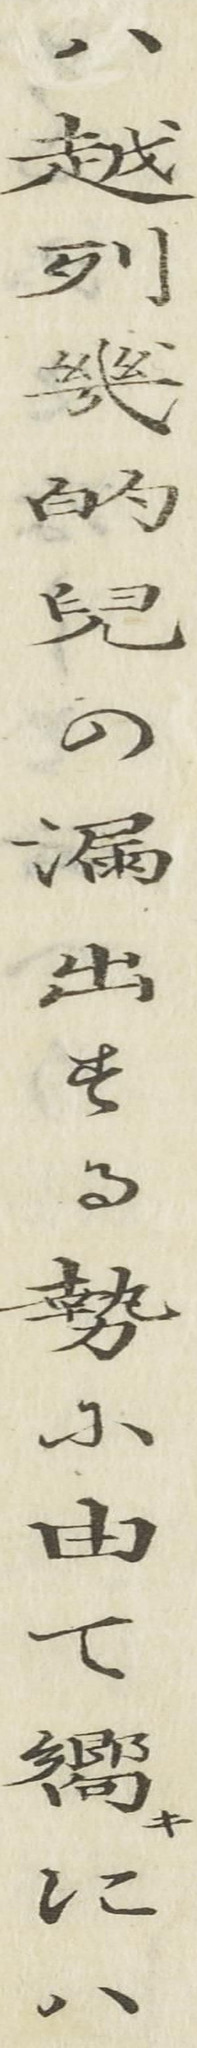は越列幾的児の漏出する勢に由て嚮きには
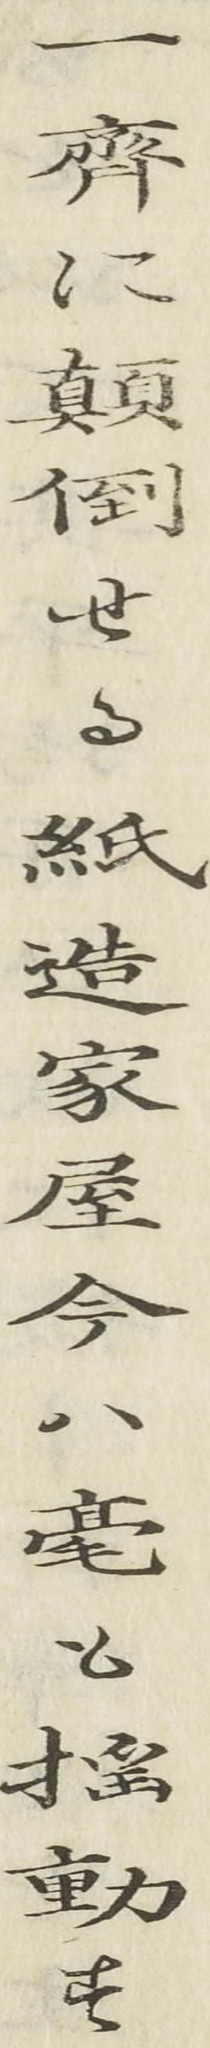一斉に顛倒せる紙造家屋今は毫も動揺す
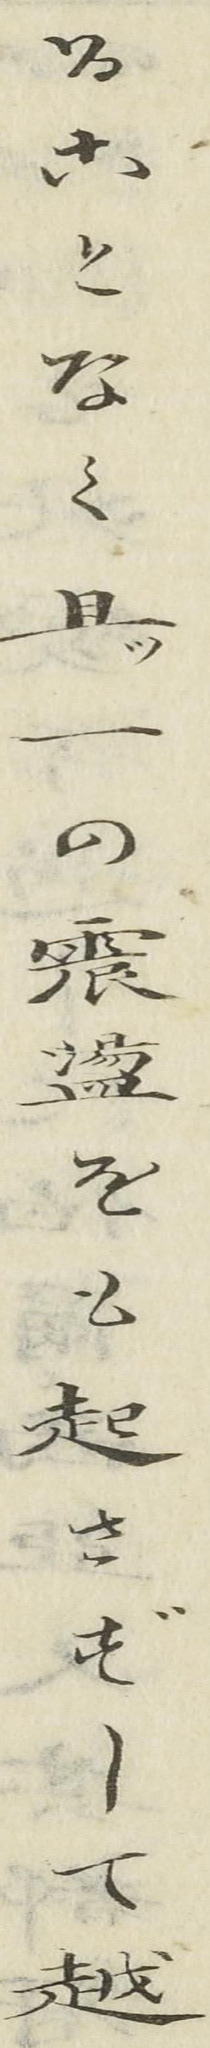ることなく且つ一の震盪をも起さずして越
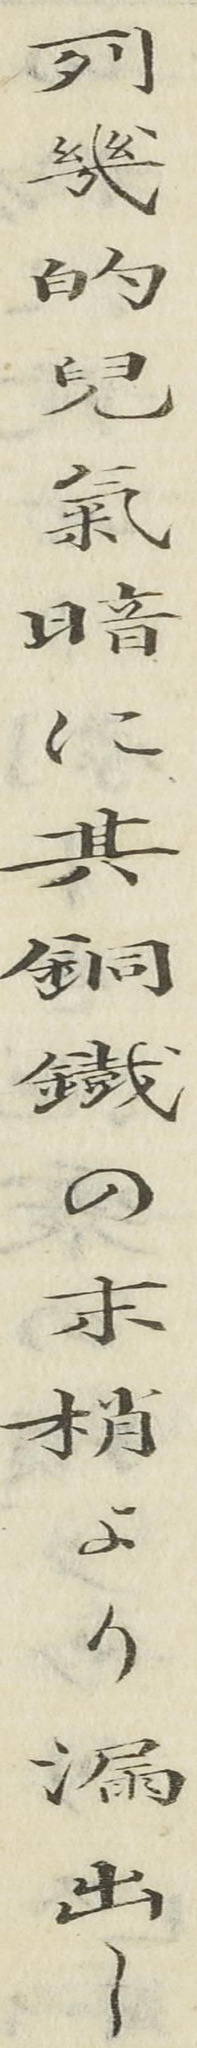列幾的児気暗に其銅鉄の末梢より漏出し
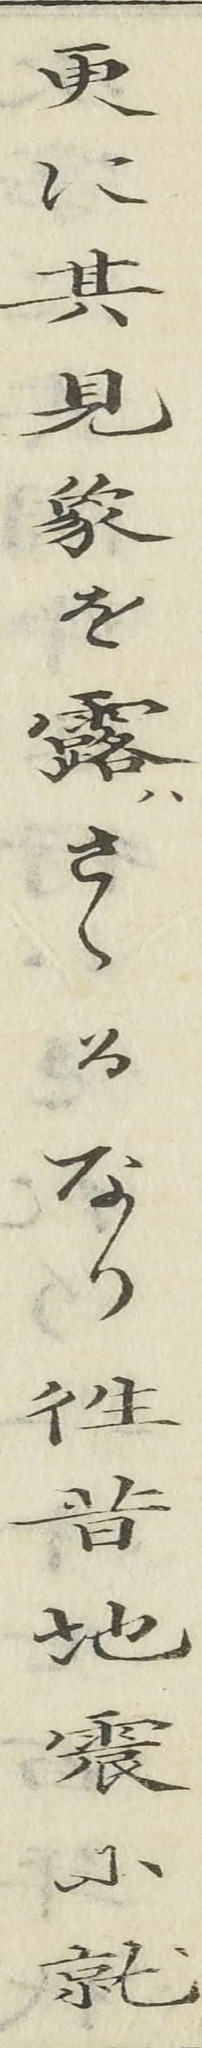更に其見象を露はさゝるなり往昔地震に就
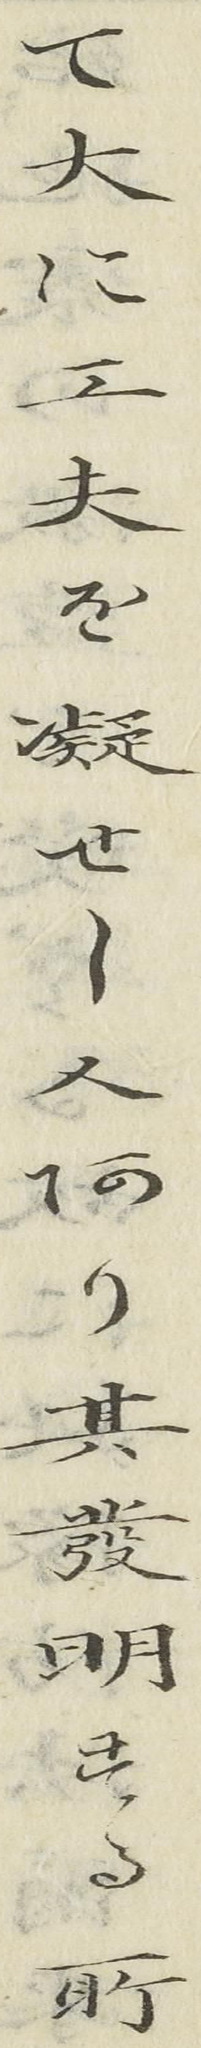て大に工夫を凝せし人あり其発明する所
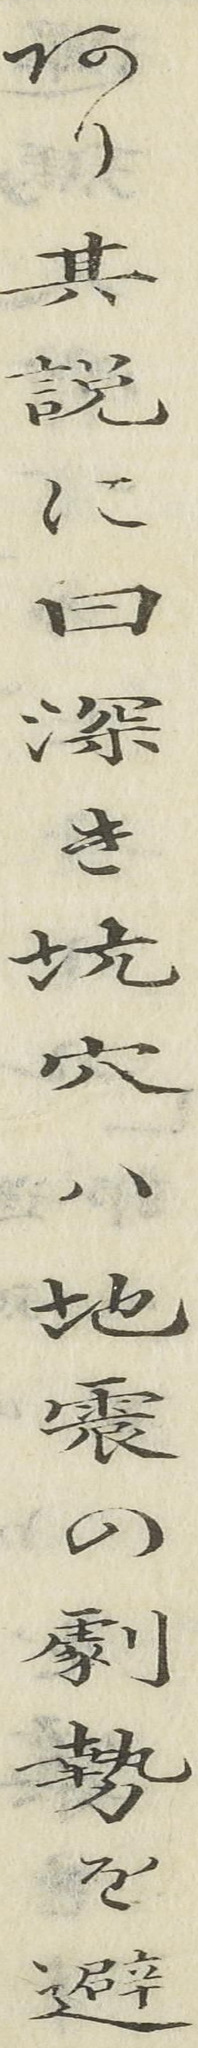あり其説に曰深き坑穴は地震の劇勢を避
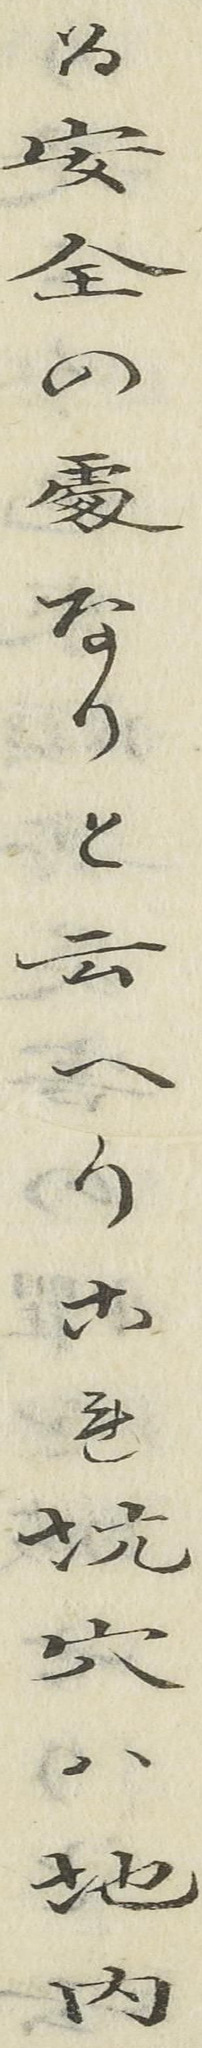る安全の処なりと云へりこれ坑穴は地内
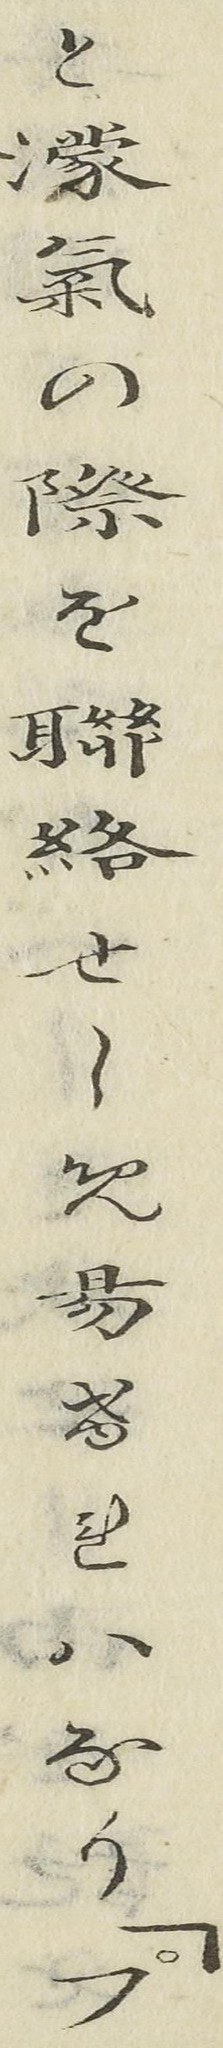と濛気の際を連絡せしめ易けれはなり「プ
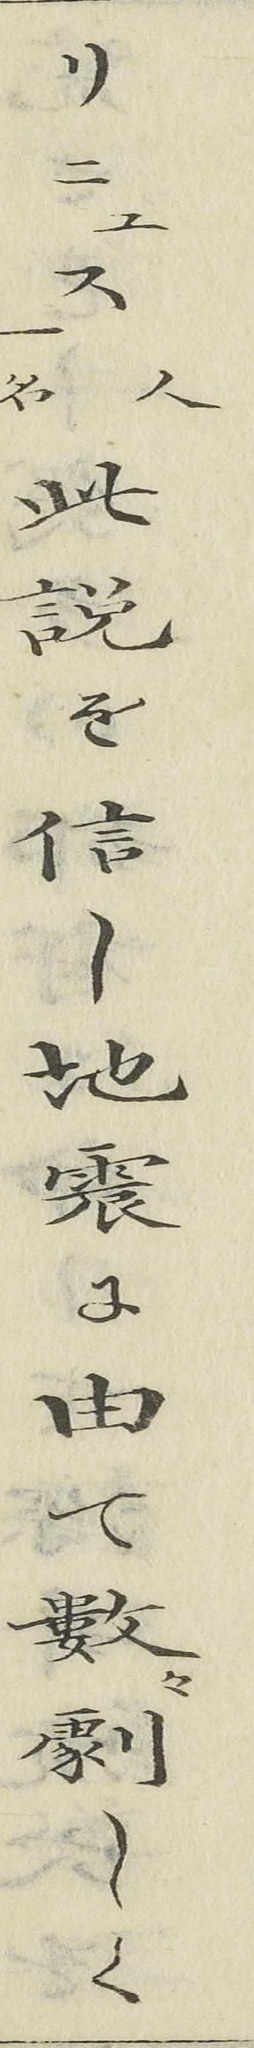リニュス」人名此説を信し地震に由て数々劇しく

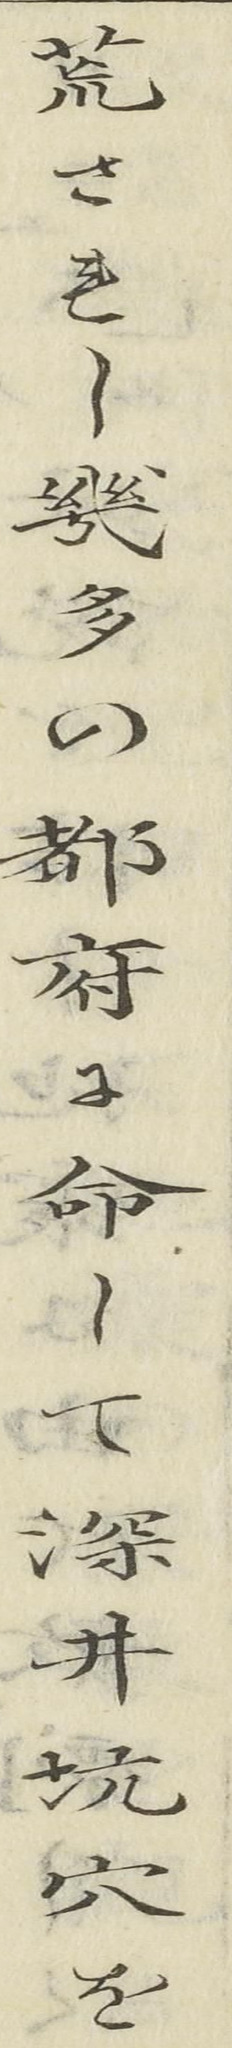荒されし幾多の都府に命じて深井坑穴を
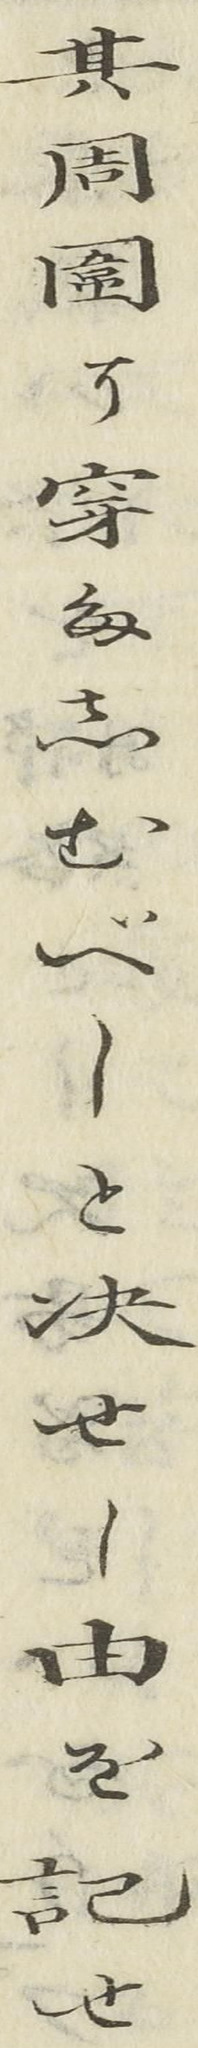其周囲に穿たしむべしと決せし由を記せ
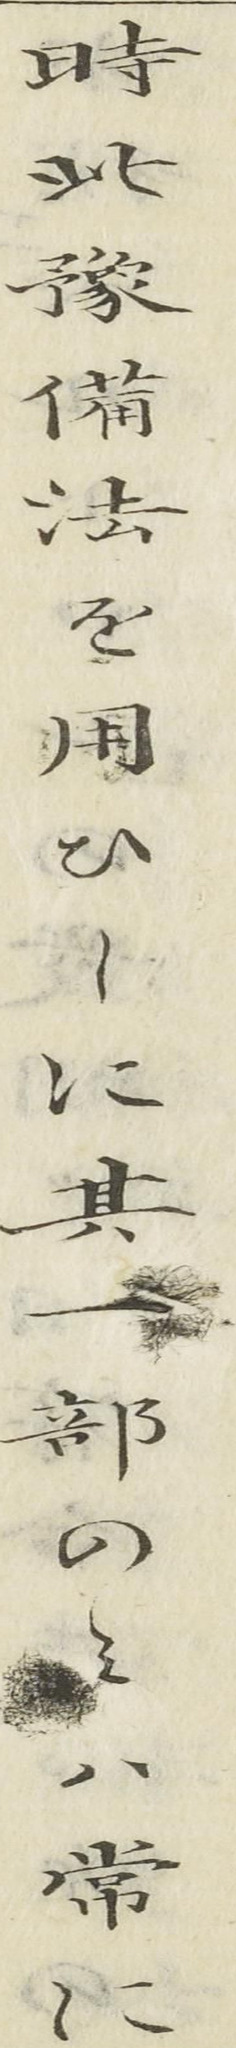時此予備法を用ひしに其一部のみは常に
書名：地震預防説
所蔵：東京大学地震研究所図書室 Earthquake Research Institute Library, The University of Tokyo, JAPAN
